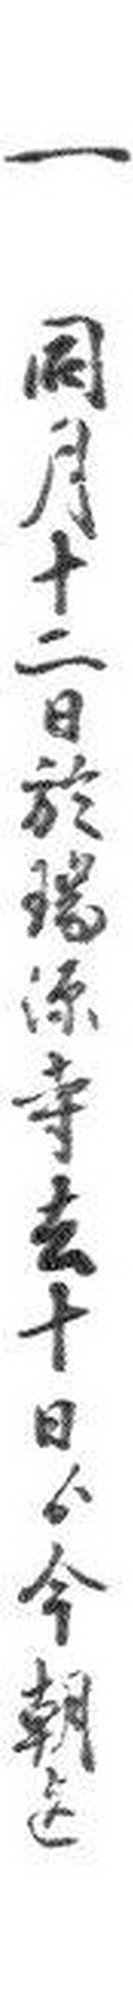一同月十二日於瑞源寺去十日ゟ今朝迄
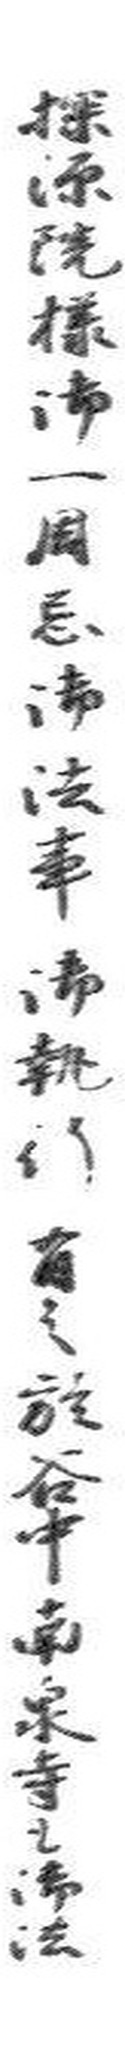探源院様御一周忌御法事御執行有之於谷中南泉寺も御法
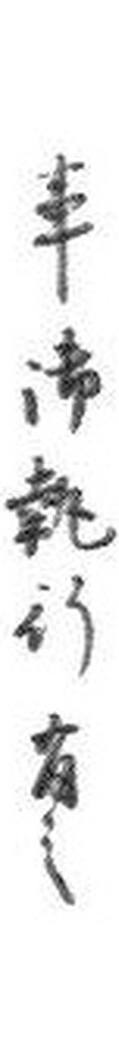亊御執行有之
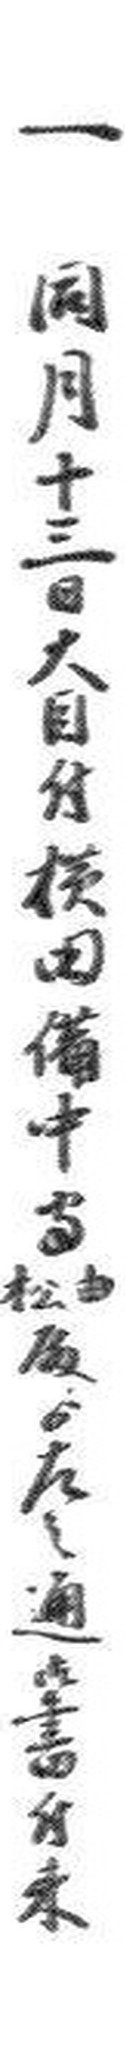一同月十三日大目付横田備中守由松殿ゟ書付来
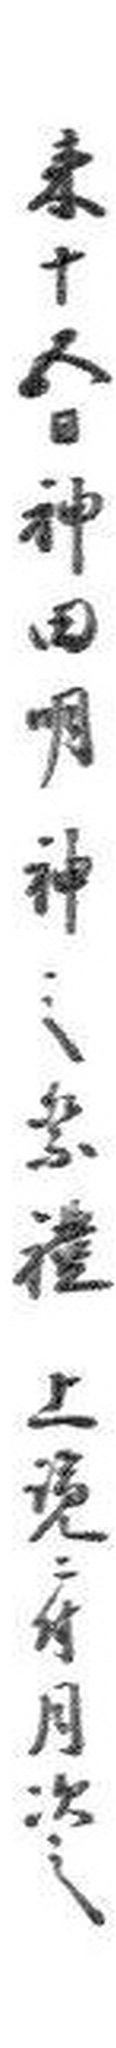来十五日神田明神之祭礼上覧ニ付月次之
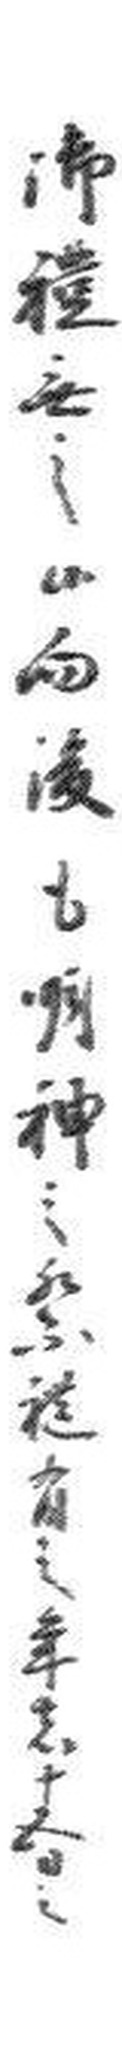御礼無之候向後も明神之祭礼有之年者十五日之
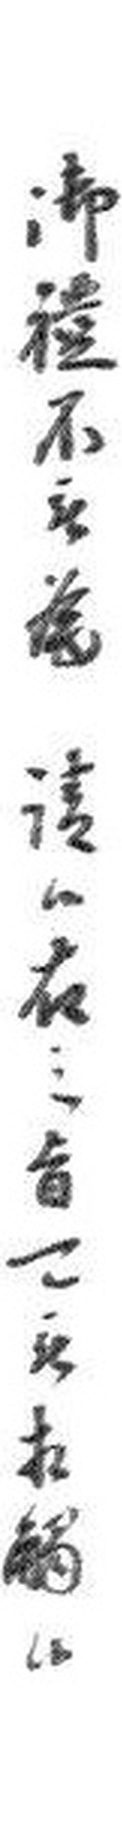御礼不被為請候右之旨可被相触候
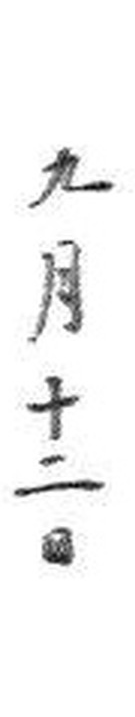九月十二日
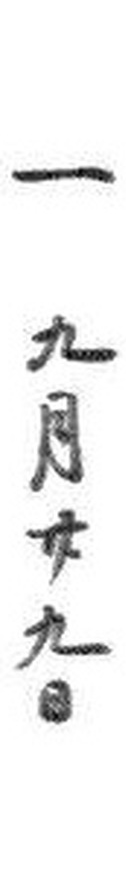一九月廿九日

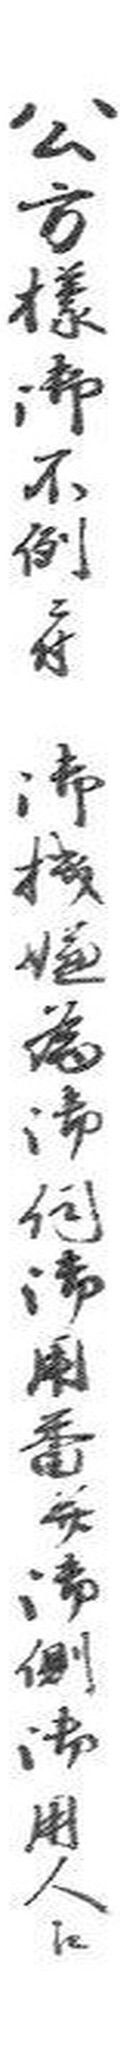公方様御不例ニ付御機嫌為御伺御用番并御側御用人江
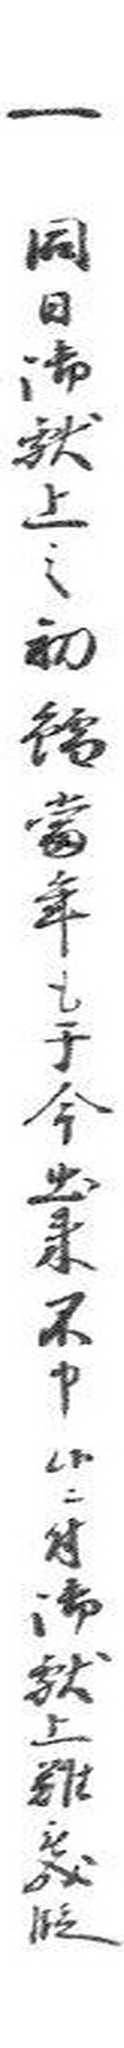一同日御献上之初鱈当年も于今出来不申候ニ付御献上難被成段
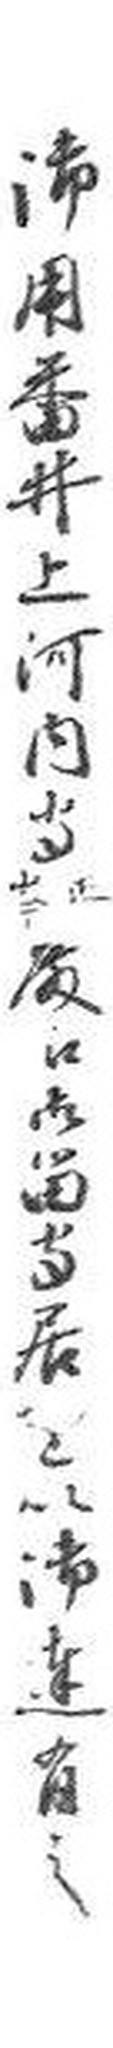御用番井上河内守正峯殿江御留守居を以御達有之
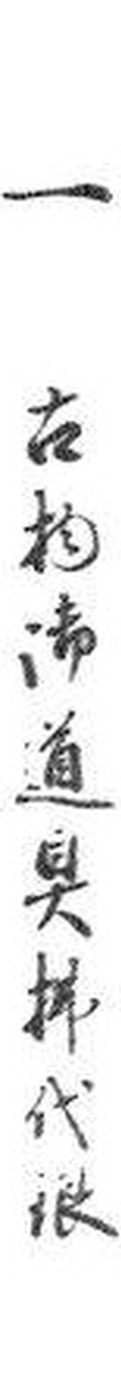一古物御道具払代銀
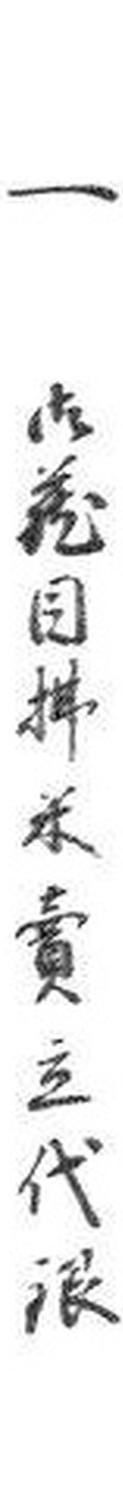一御蔵目払米売立代銀
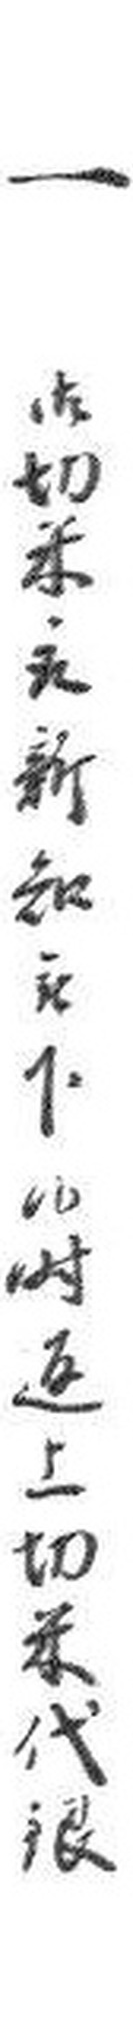一御切米取新知被下候時返上切米代銀
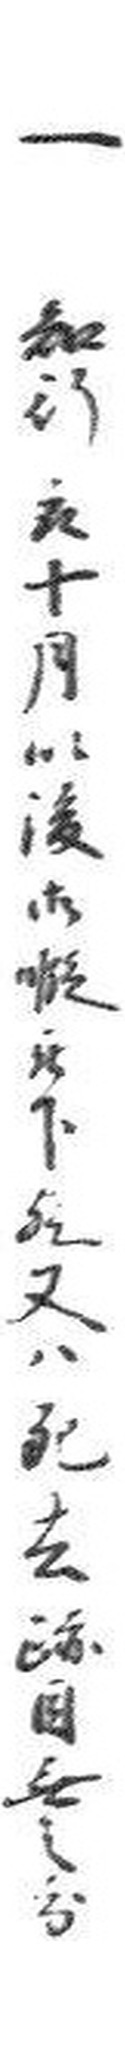一知行取十月以後御暇被下歟又ハ死去跡目無之分
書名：家譜 二十九 吉邦公 従正徳二年到正徳三年
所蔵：福井県文書館 Fukui Prefectural Archives
